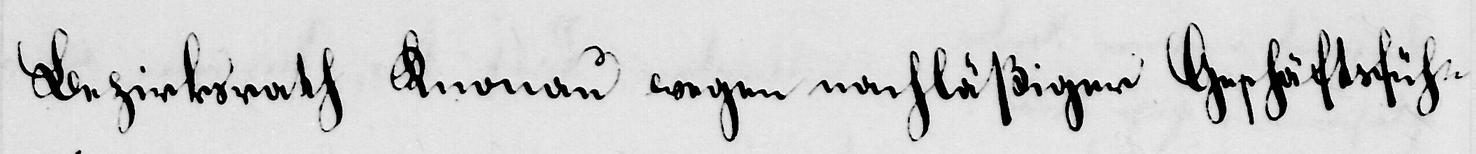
Bezirksrath Knonau wegen nachläßiger Geschäftsfüh¬
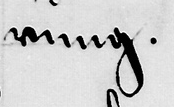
rung.
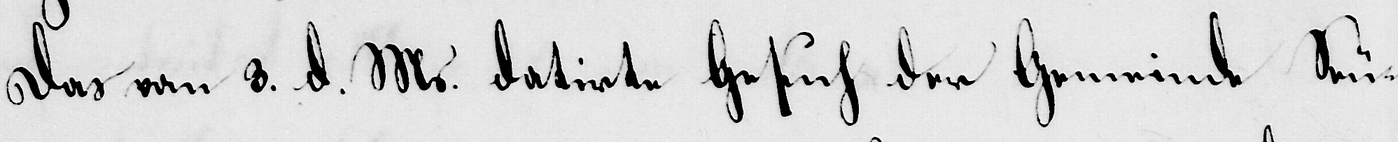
Das vom 3. d. Ms. datirte Gesuch der Gemeinde Seu¬
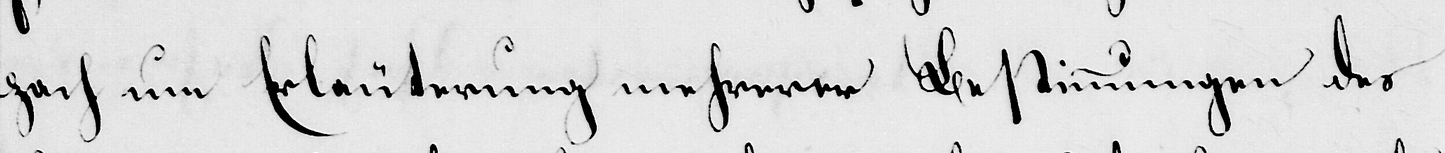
zach um Erläuterung mehrerer Bestimmungen des
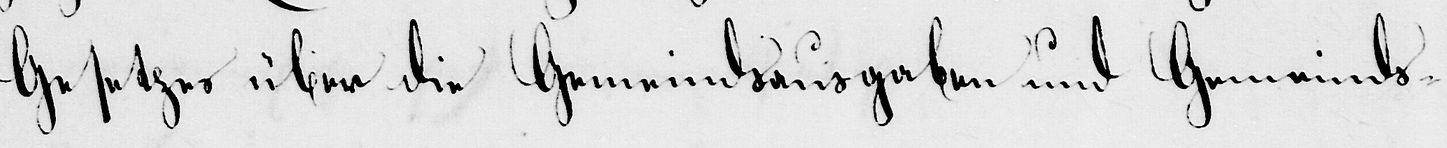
Gesetzes über die Gemeindsausgaben und Gemeinds¬
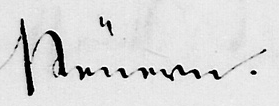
steuern.
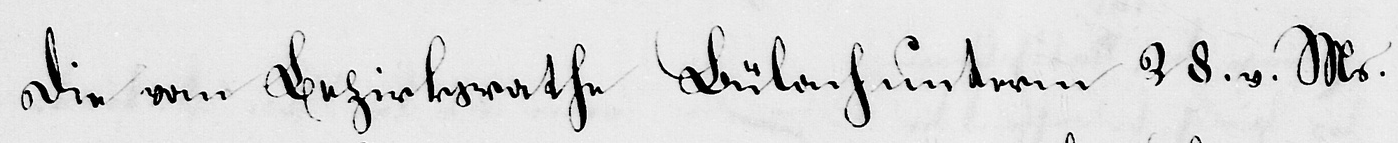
Die vom Bezirksrathe Bülach unterm 28. v .Ms.
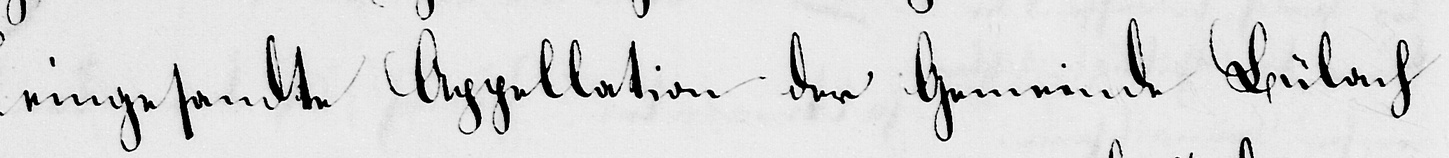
eingesandte Appellation der Gemeinde Bülach
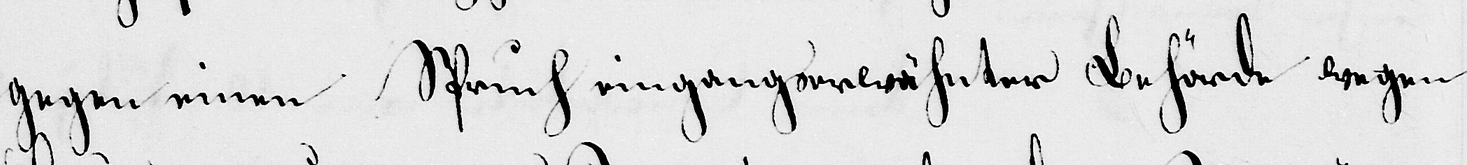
gegen einen Spruch eingangserwähnter Behörde wegen
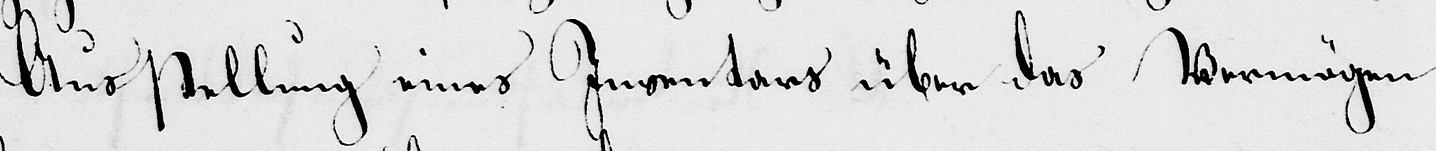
Ausstellung eines Inventars über das Vermögen
